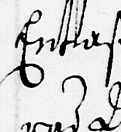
5.
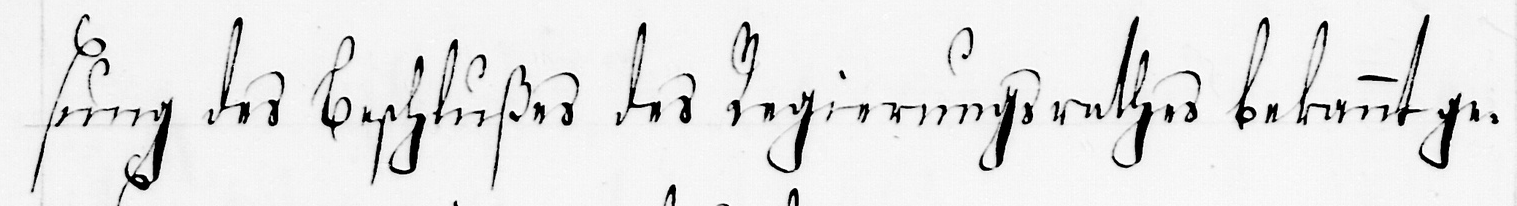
sung des Beschlußes des Regierungsrathes bekannt ge¬
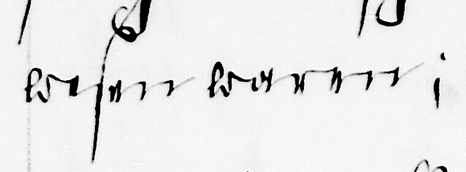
wesen waren;
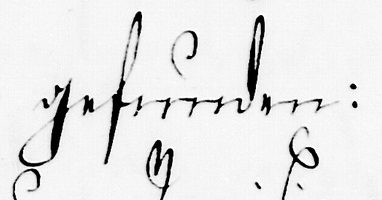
gefunden:
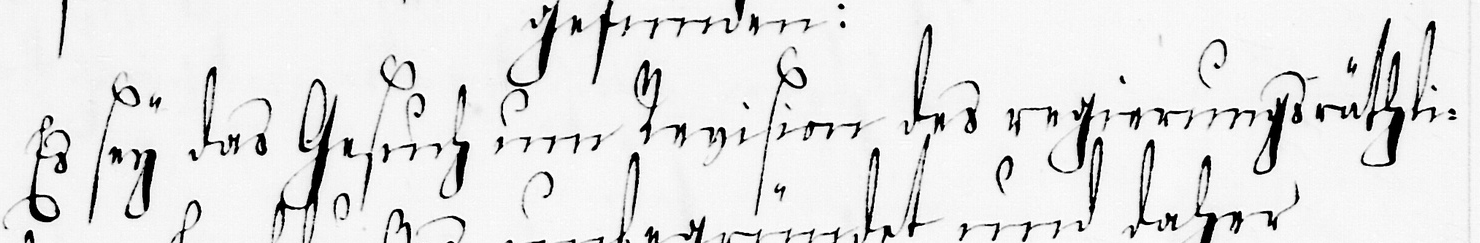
Es sey das Gesuch um Revision des regierungsräthli¬
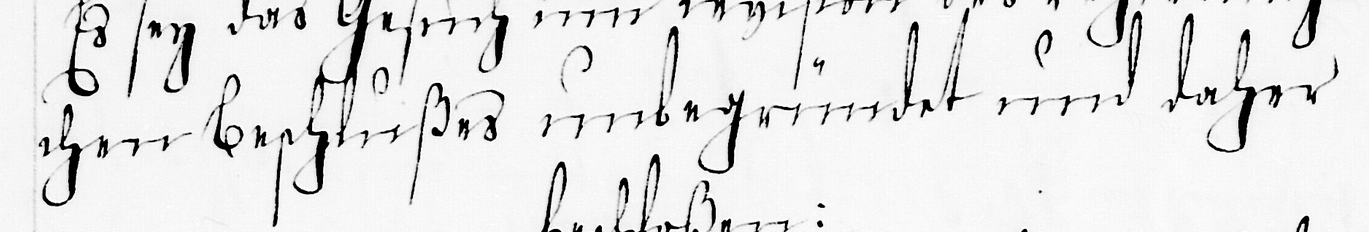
chen Beschlußes unbegründet und daher
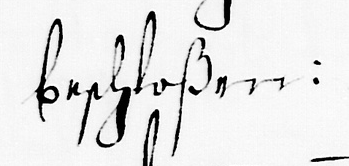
beschloßen:
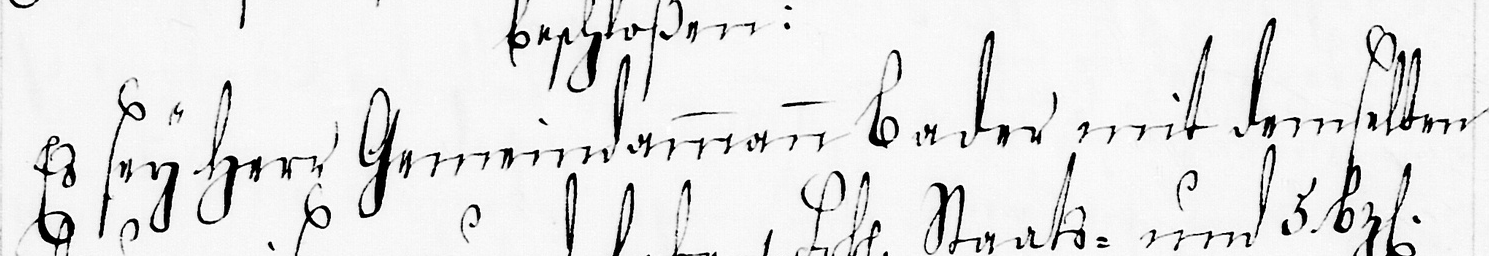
Es sey Herr Gemeindammann Bader mit demselben
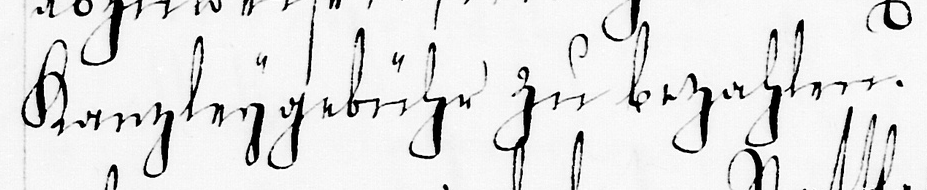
Kanzleygebühr zu bezahlen.
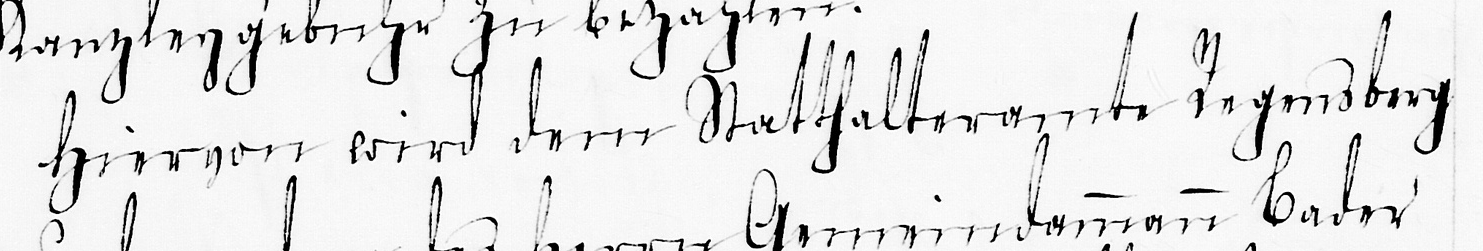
Hiervon wird dem Statthalteramte Regensberg
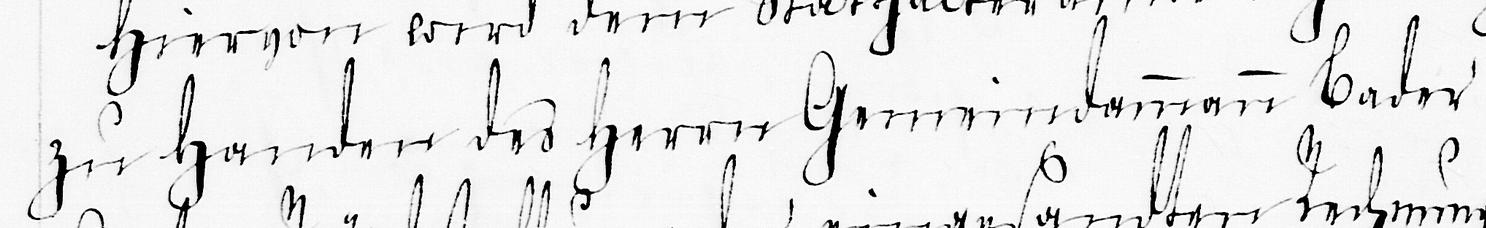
zu Handen des Herrn Gemeindammann Bader
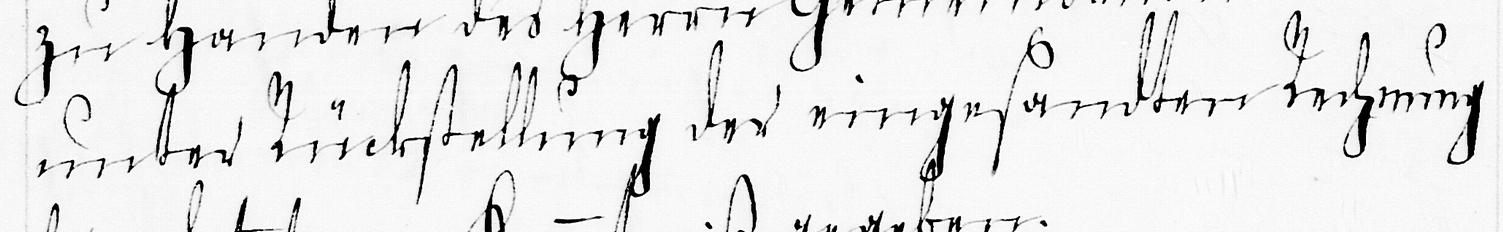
unter Rückstellung der eingesandten Rechnung
